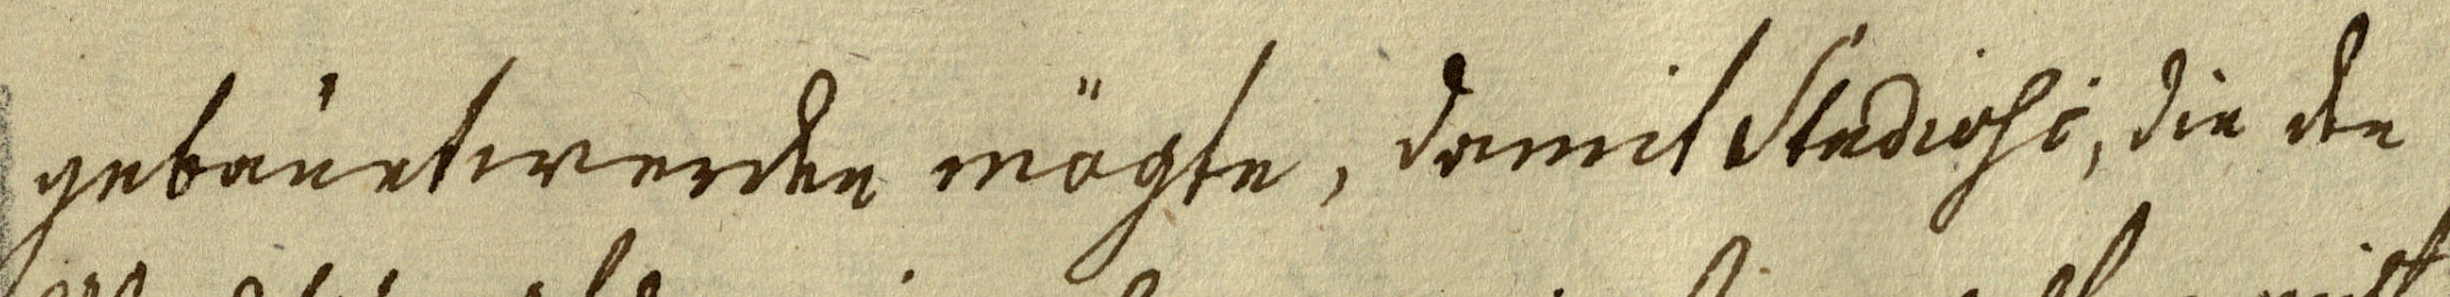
gebaut werden mögte, damit Studiosi, die den
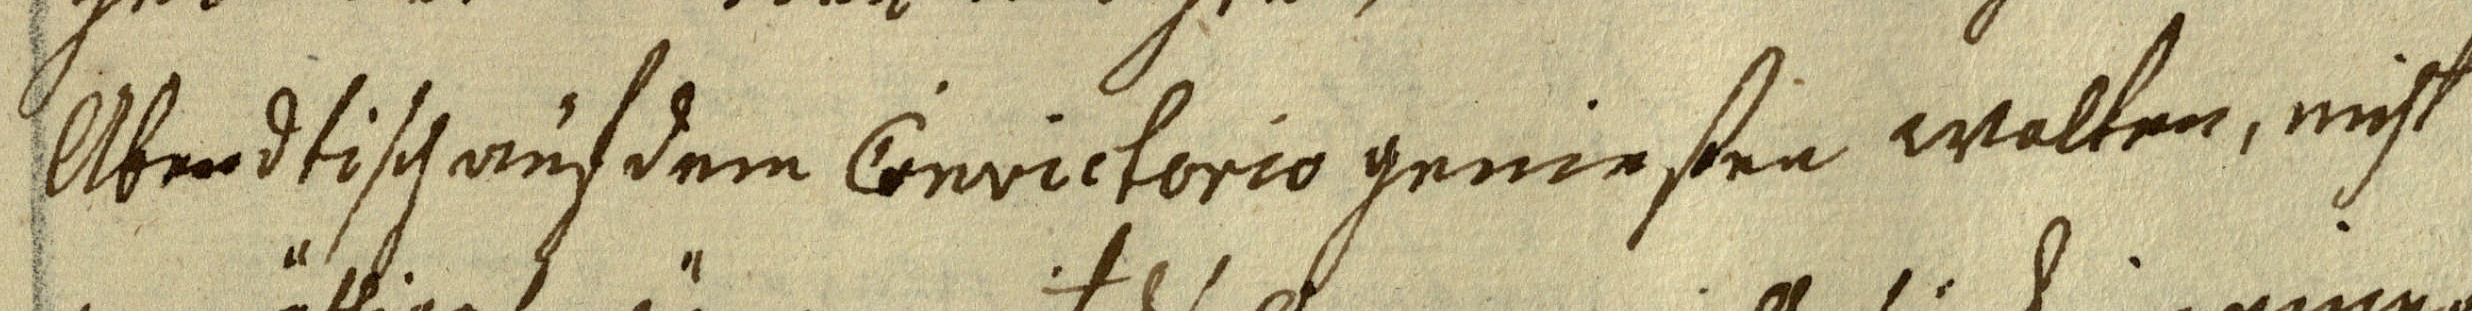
Abendtisch auf dem Convictorio genießen wolten, nicht
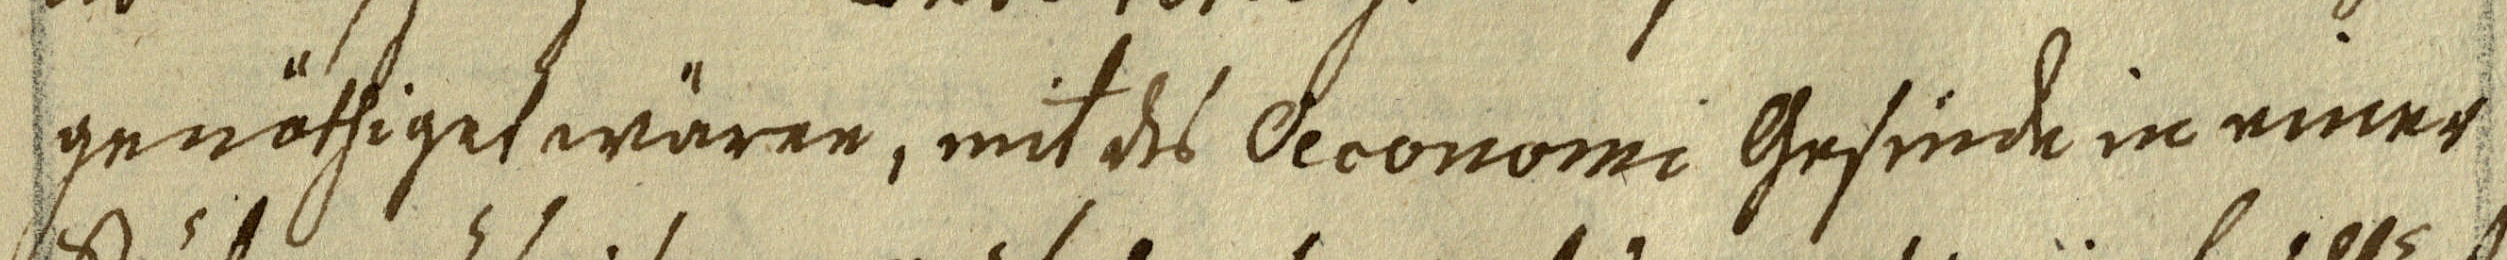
genöthiget wären, mit der Oeconomi Gesinde in einer
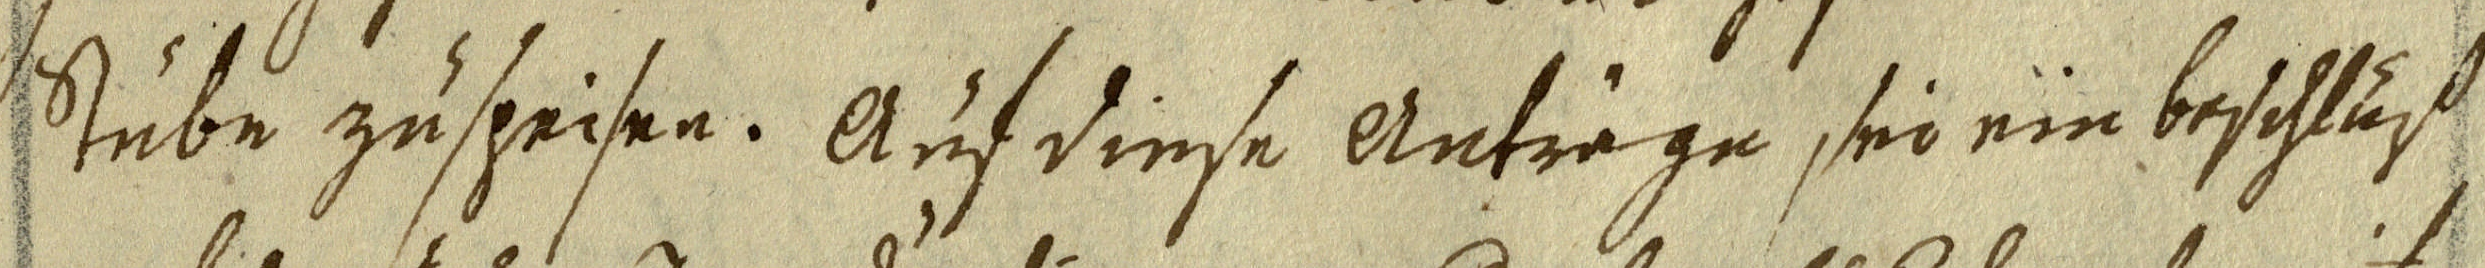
Stube zu speisen. Auf diese Anträge sei ein Beschluß
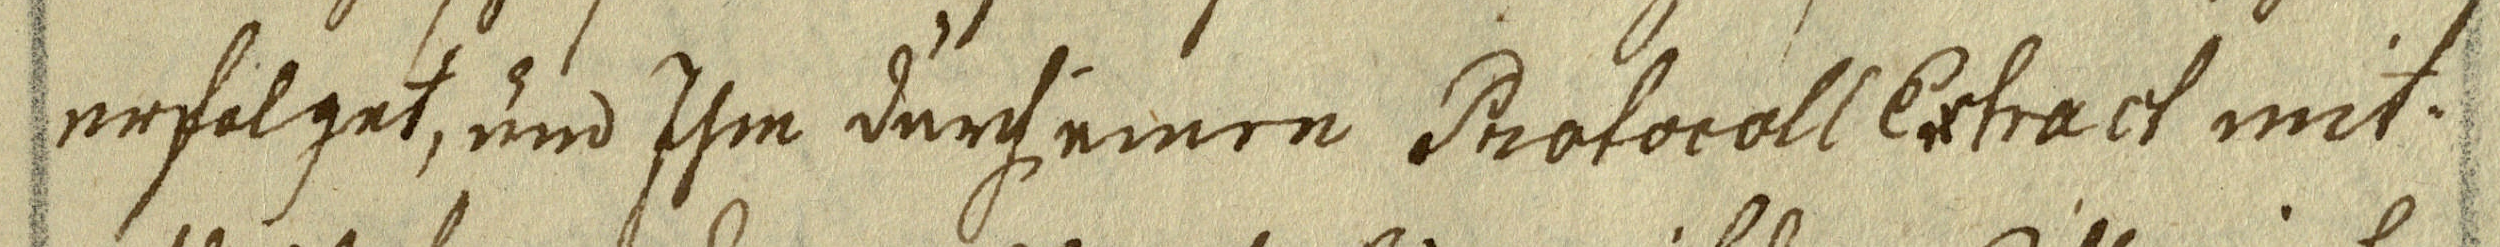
erfolget, und Ihm durch einen Protocoll Extract mit¬
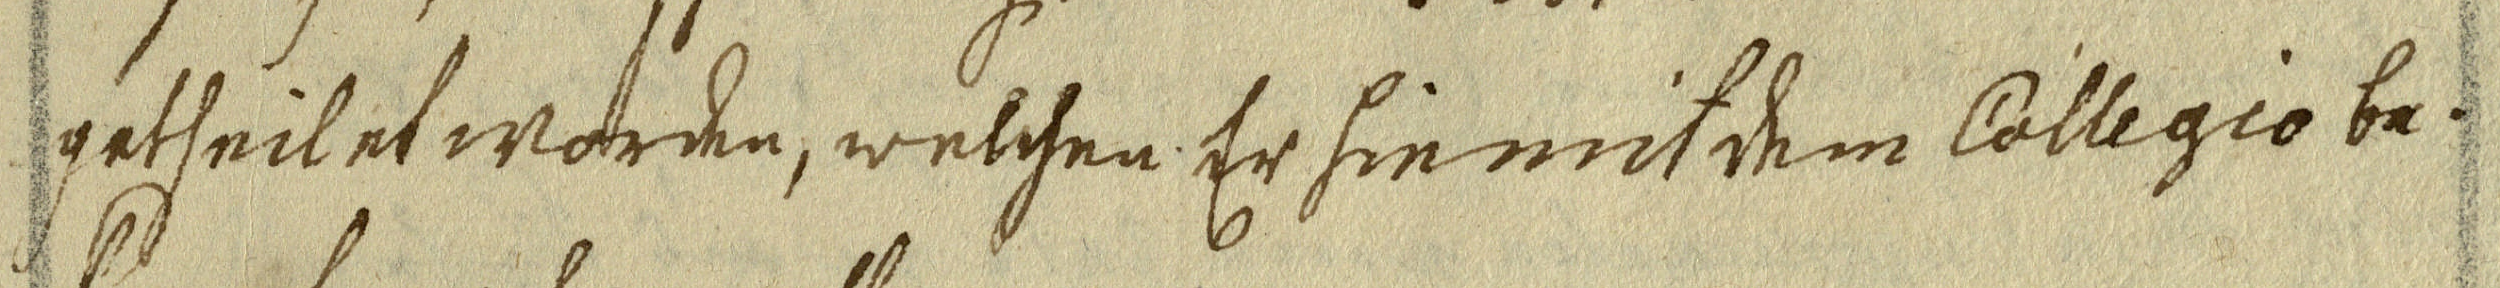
getheilet worden, welchen Er hiemit dem Collegio be¬
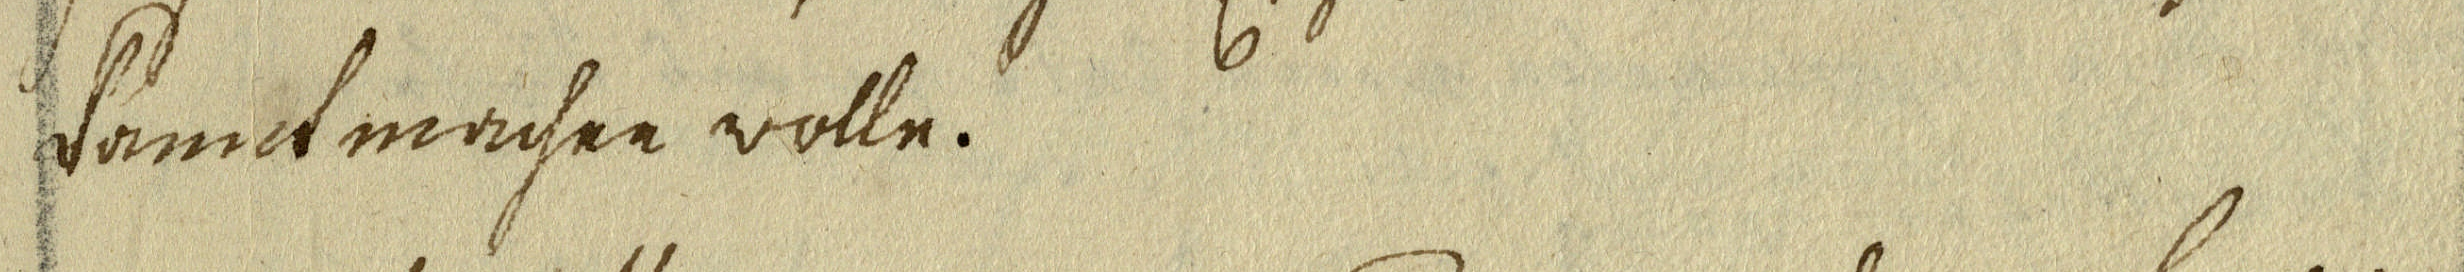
kannt machen wolle.
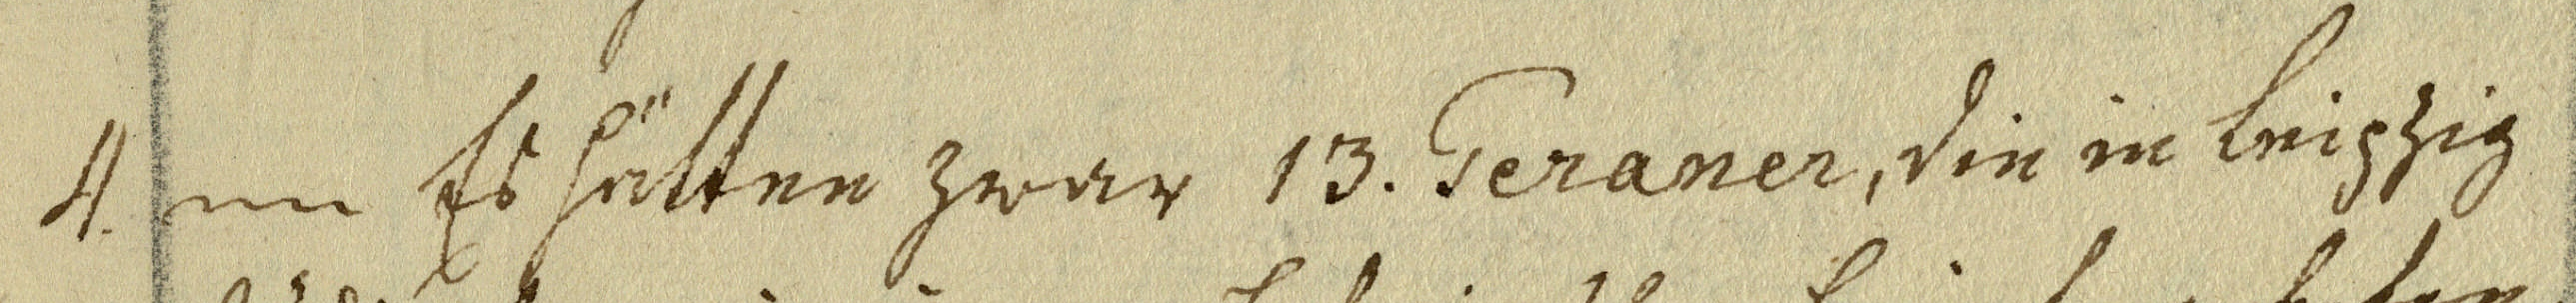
4. Es hätten zwar 13 Geraner, die in Leipzig
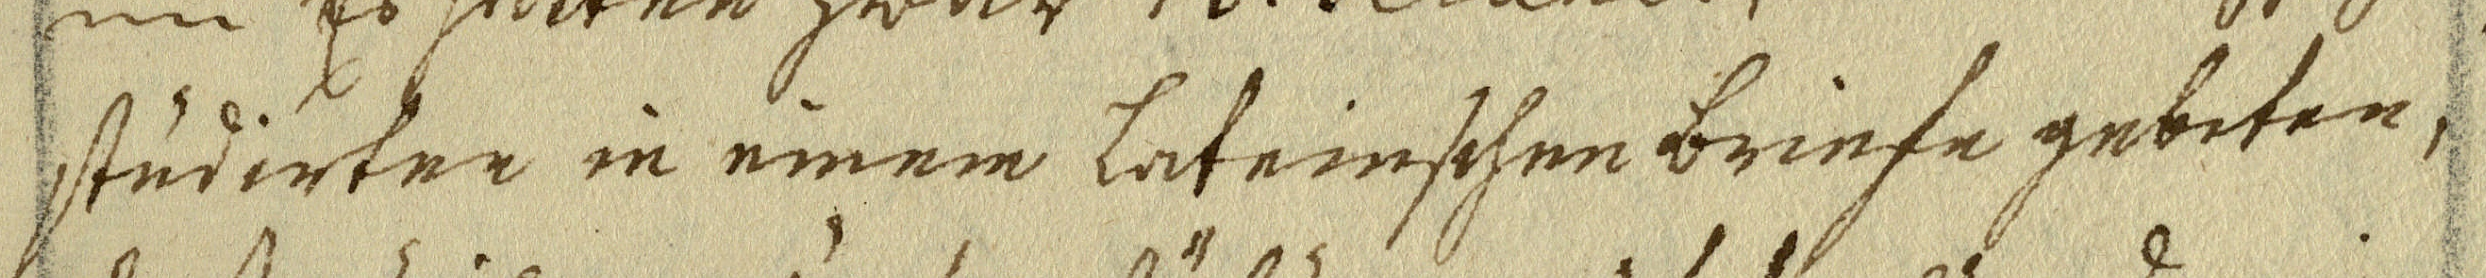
studirten in einem lateinischen Briefe gebeten,
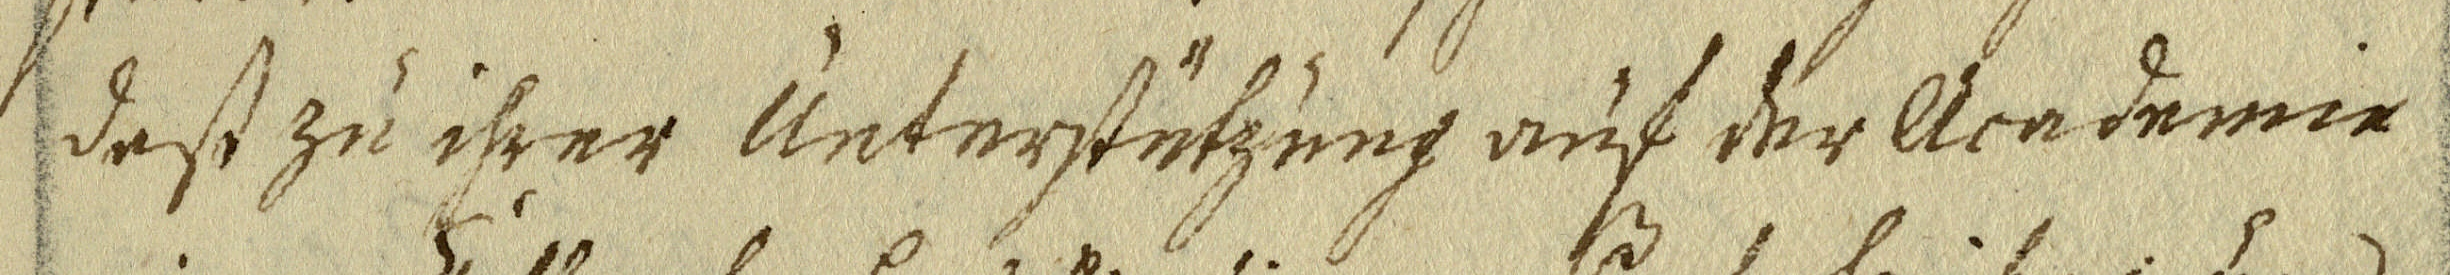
daß zu ihrer Unterstützung auf der Academie
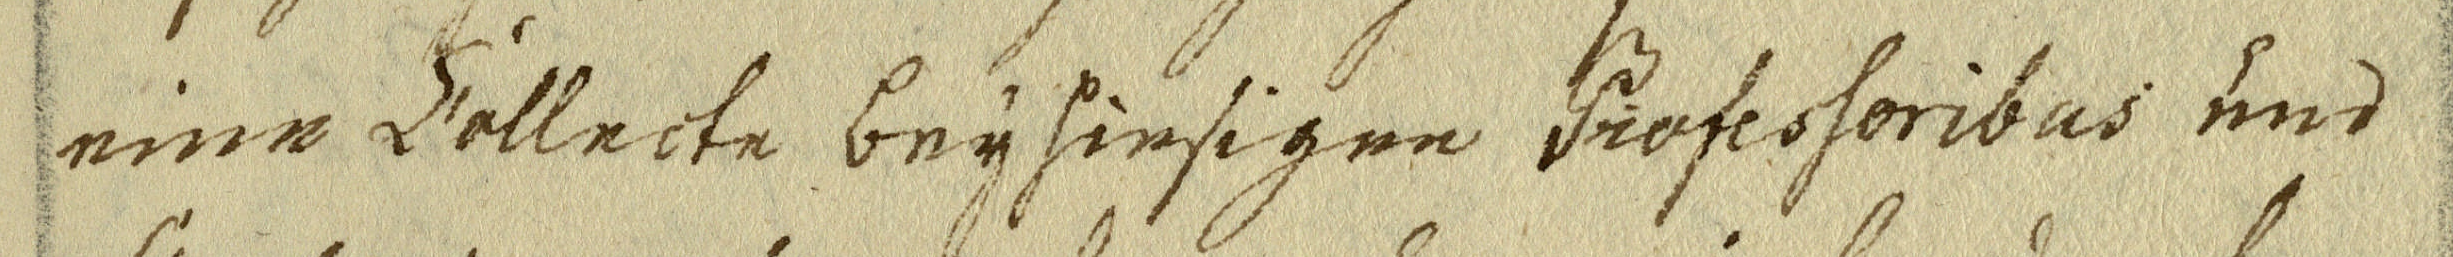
eine Collecte beÿ hiesigen Professoribus und
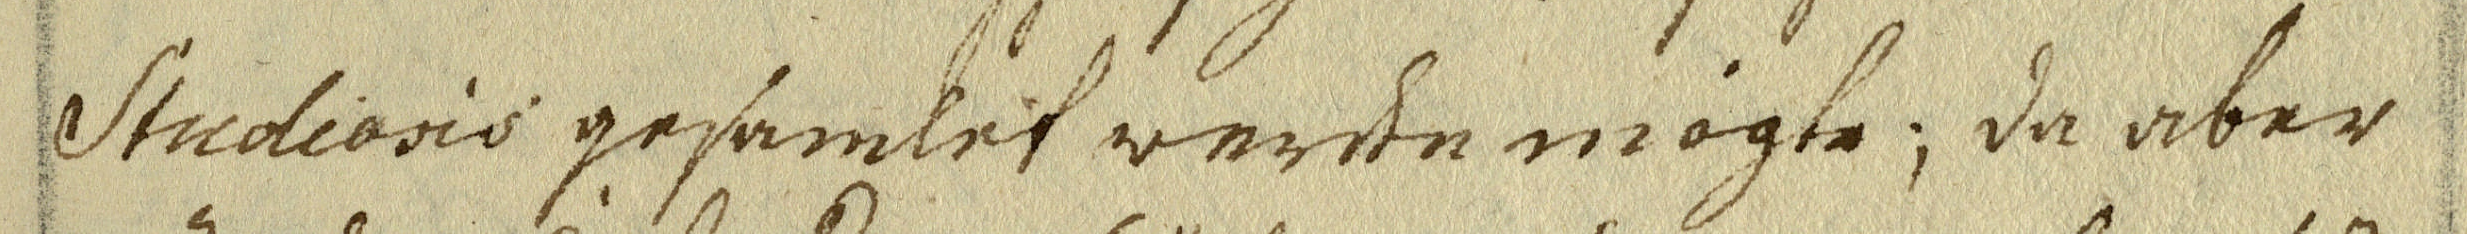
Studiosis gesamlet werden mögte; da aber
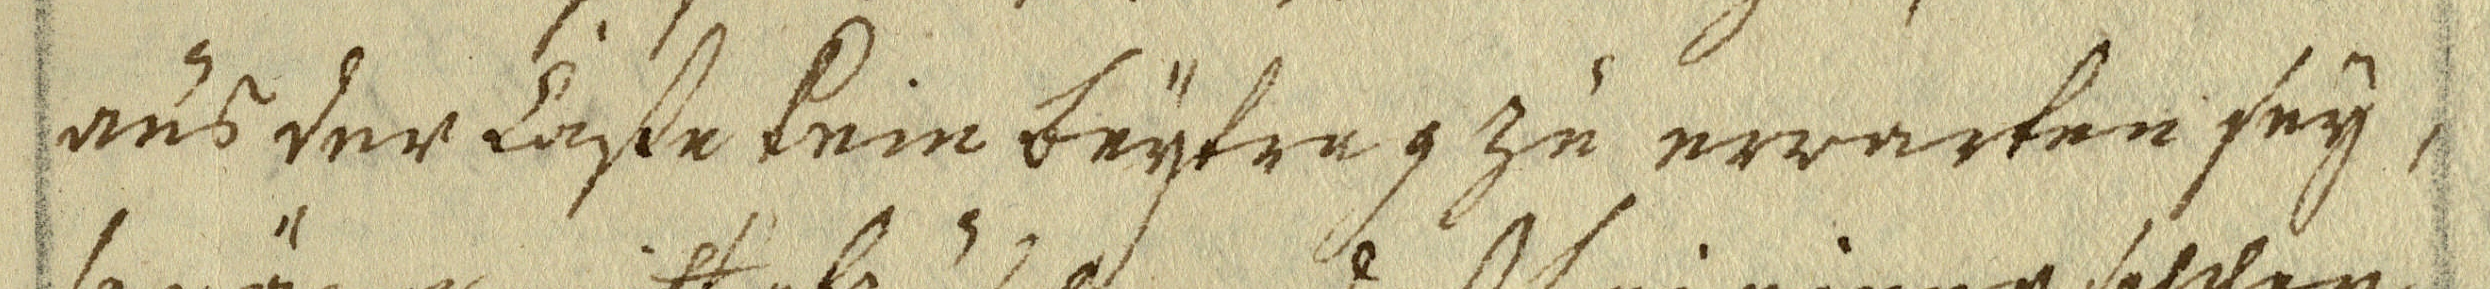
aus der Casse kein Beÿtrag zu erwarten seÿ,
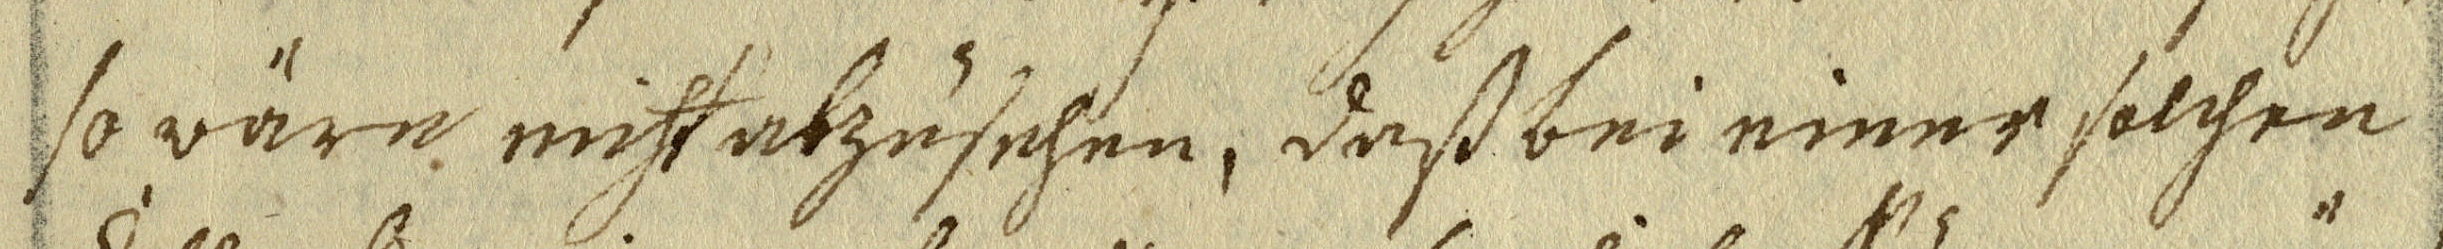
so wäre nicht abzusehen, daß bei einer solchen
